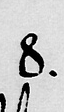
6.)
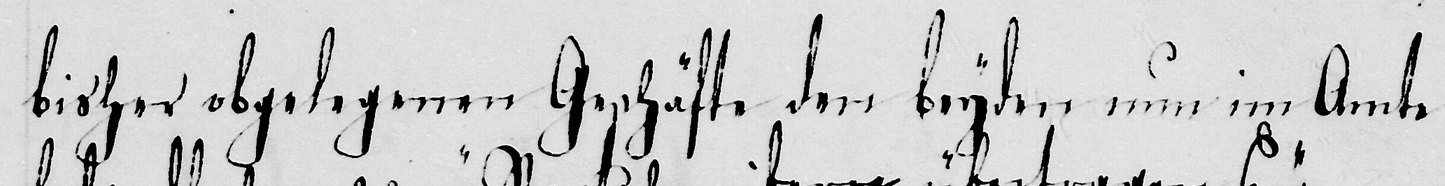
bisher obgelegenen Geschäfte den beyden nun im Amte
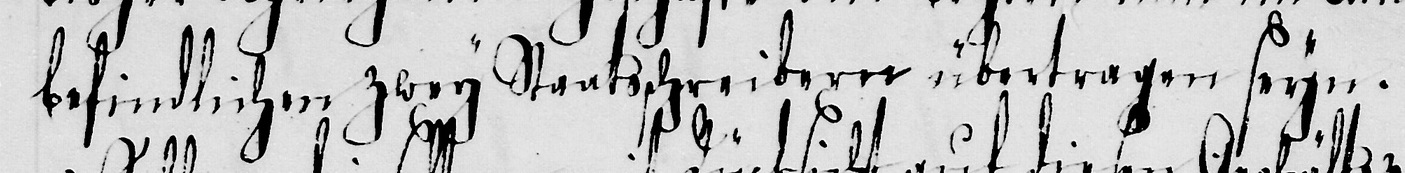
befindlichen zwey Staatsschreibern übertragen seyn.
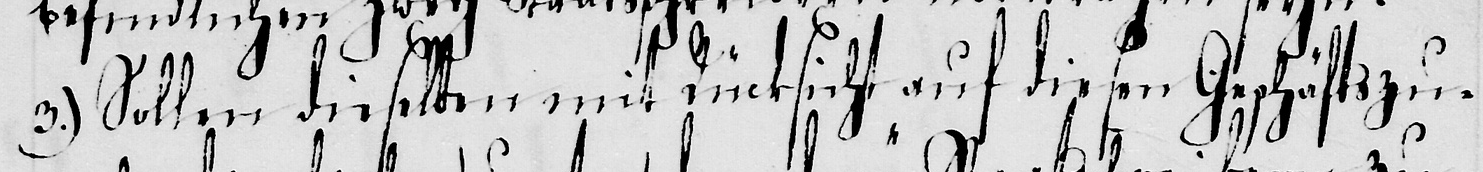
3.) Sollen dieselben mit Rücksicht auf diesen Geschäftszu¬
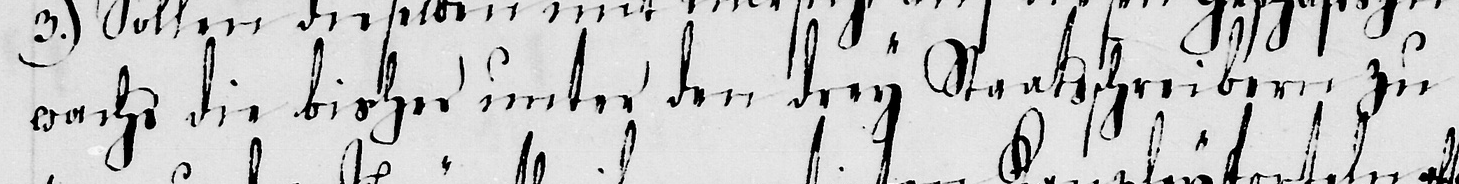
wachs die bisher unter den drey Staatsschreibern zu
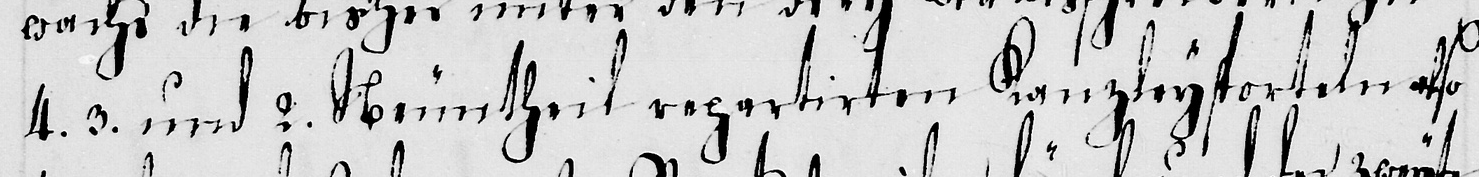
4. 3. und 2. Neuntheil repartirten Kanzleysporteln also
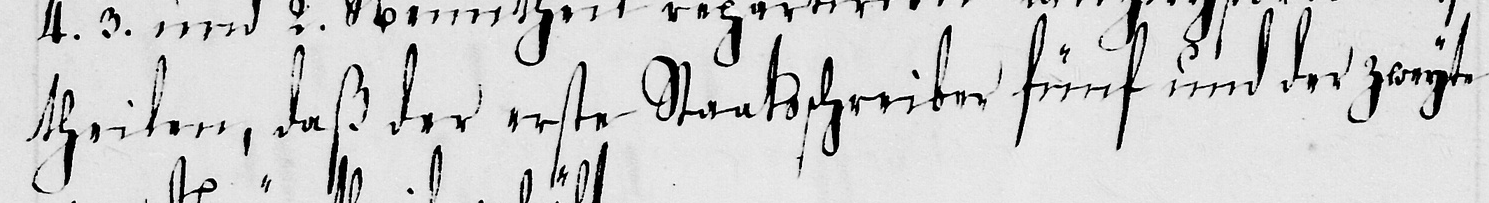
theilen, daß der erste Staatsschreiber fünf und der zweyte
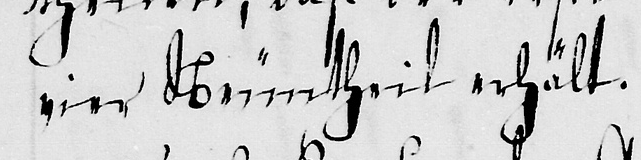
vier Neuntheil erhält.
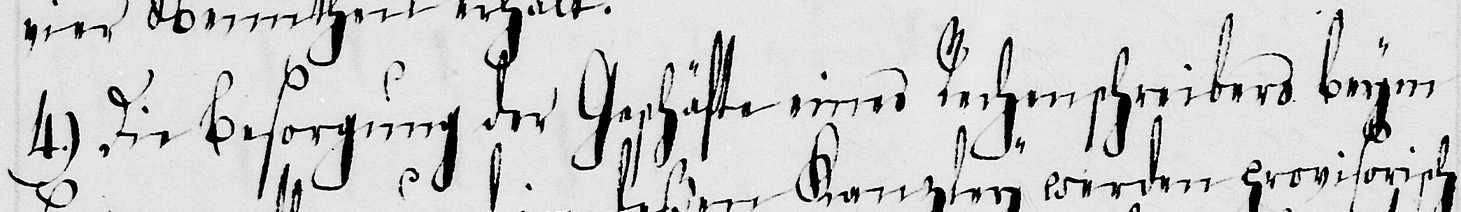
4.) Die Besorgung der Geschäfte eines Rechenschrei¬
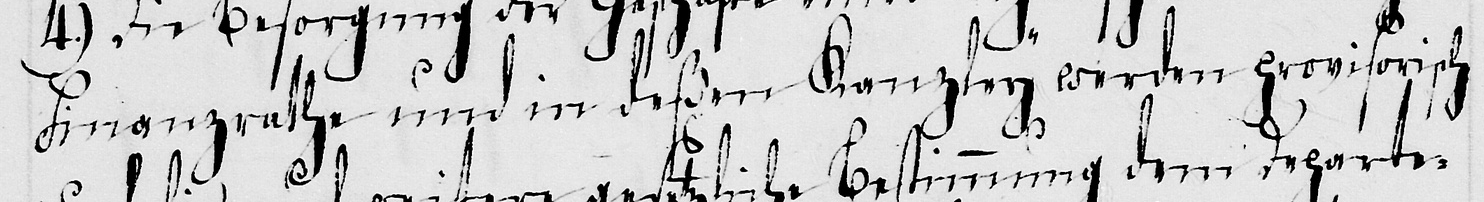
Finanzrathe und in deßen Kanzley werden provisorisch
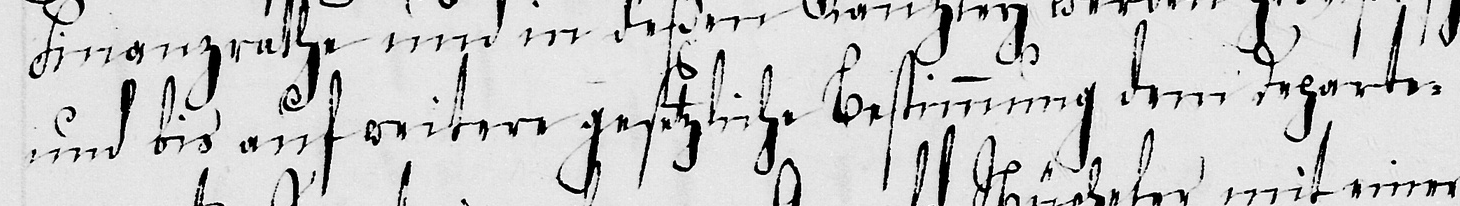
und bis auf weitere gesetzliche Bestimmung dem Departe¬
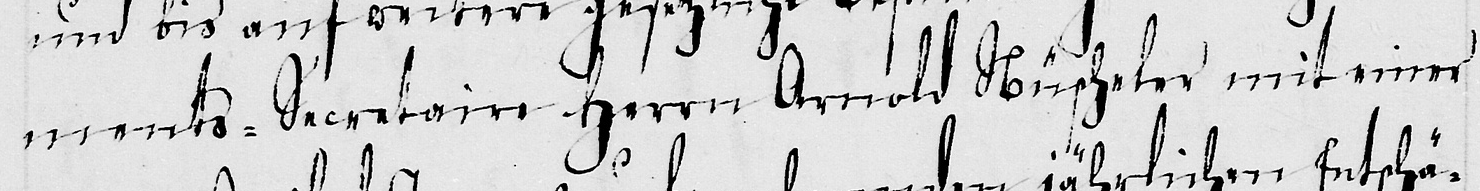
ments-Secretaire Herrn Arnold Nüscheler mit einer
